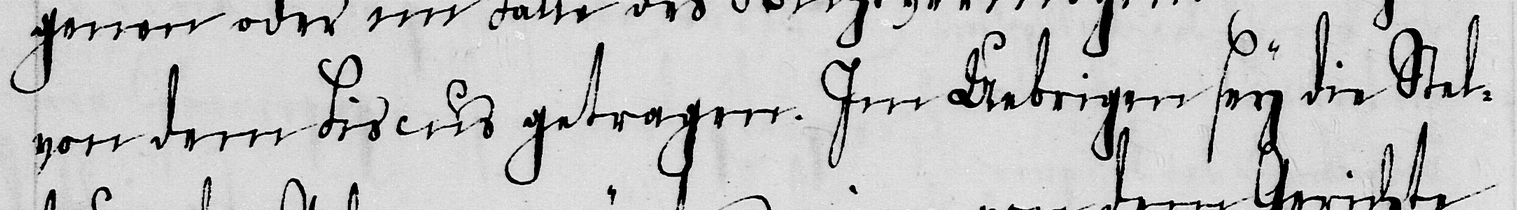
von dem Fiscus getragen. Im Uebrigen sey die Stel¬
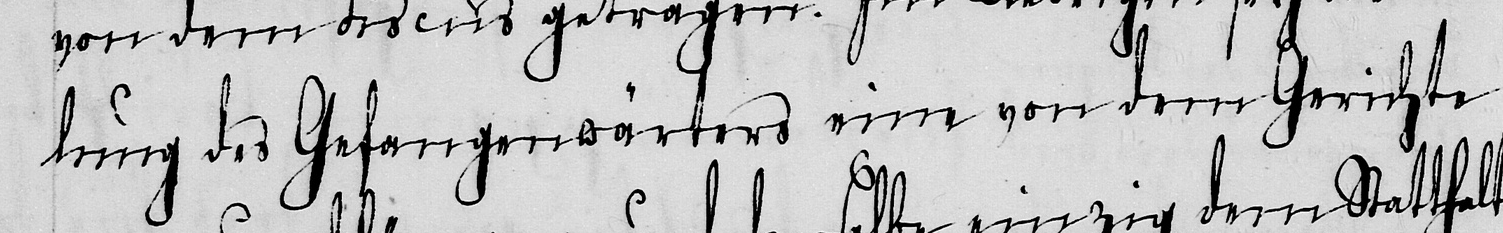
lung des Gefangenwärters eine von dem Gerichte
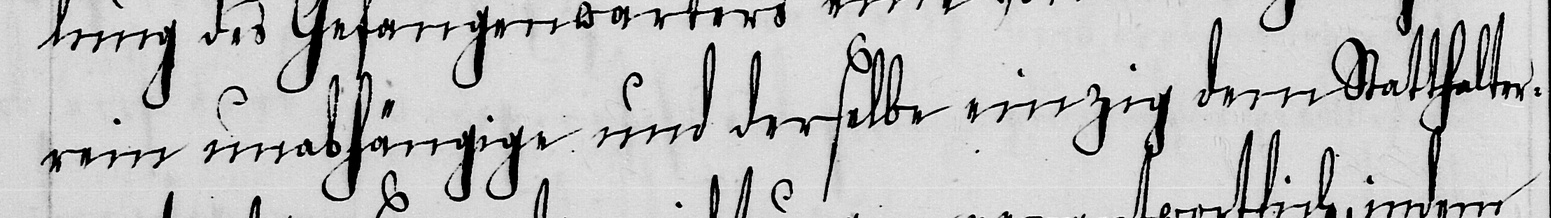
rein unabhängige und derselbe einzig dem Statthal¬
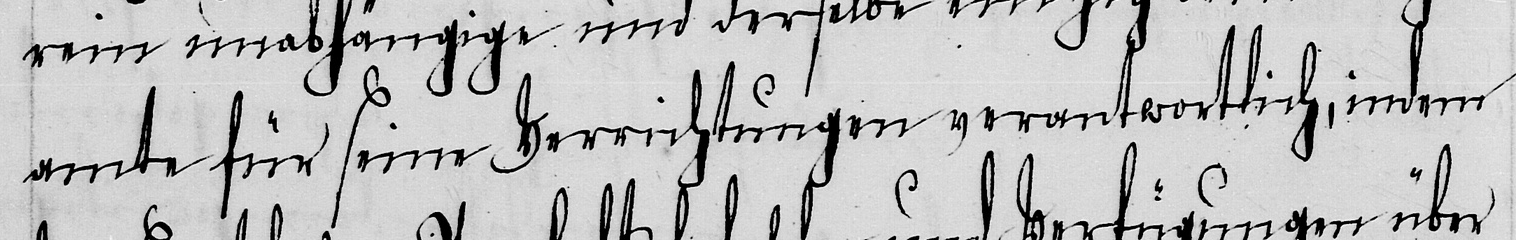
amte für seine Verrichtungen verantwortlich, indem
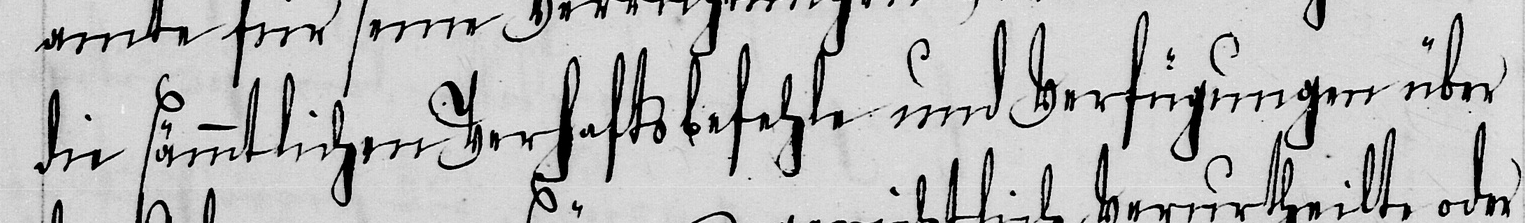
die sämmtlichen Verhaftsbefehle und Verfügungen über
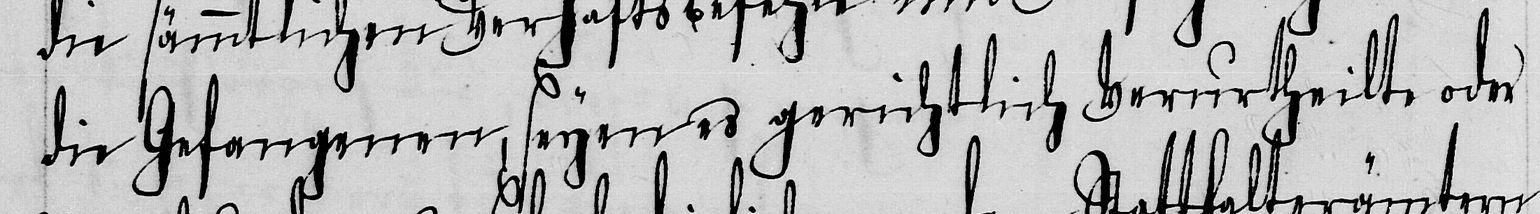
die Gefangenen, seyen es gerichtlich Verurtheilte oder
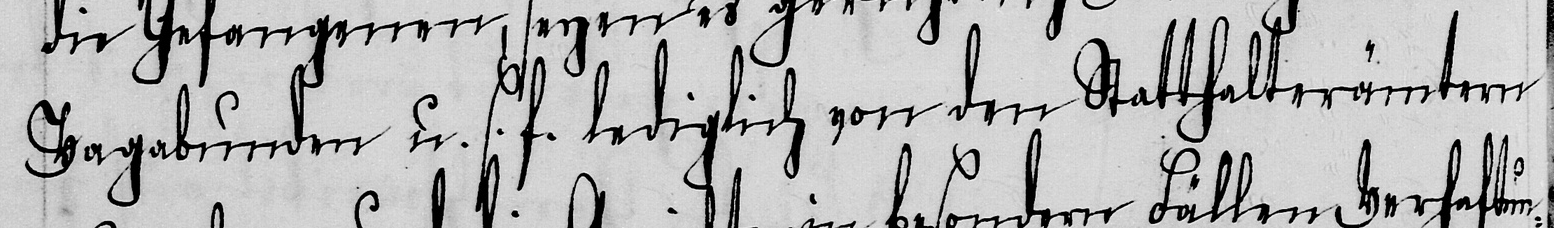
Vagabunden u. s. f. lediglich von den Statthalterämtern
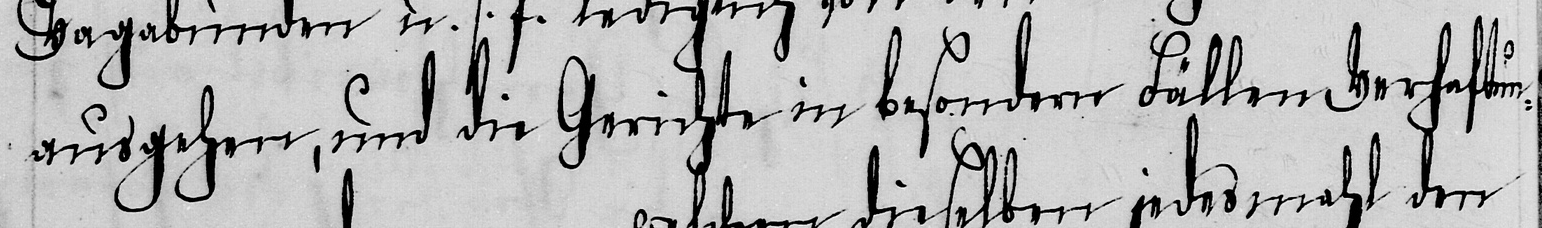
ausgehen, und die Gerichte in besondern Fällen Verhaftu¬
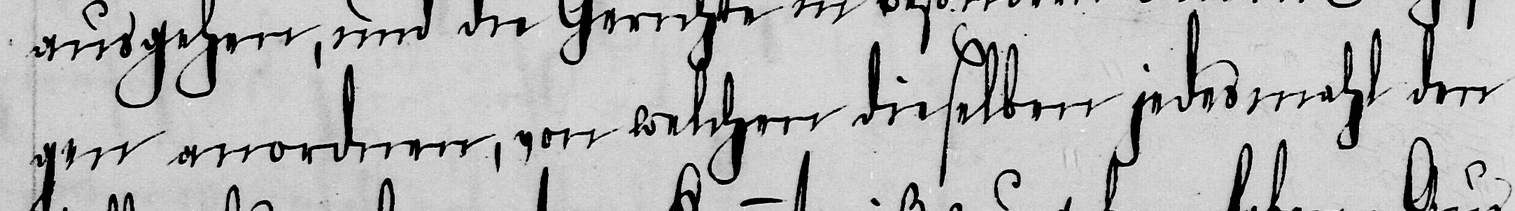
ngen anordnen, von welchen dieselben jedesmahl den
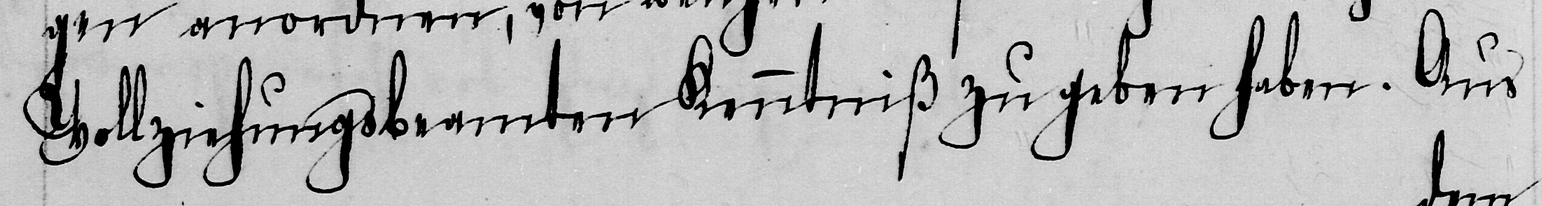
Vollziehungsbeamten Kenntniß zu geben habe. Aus
